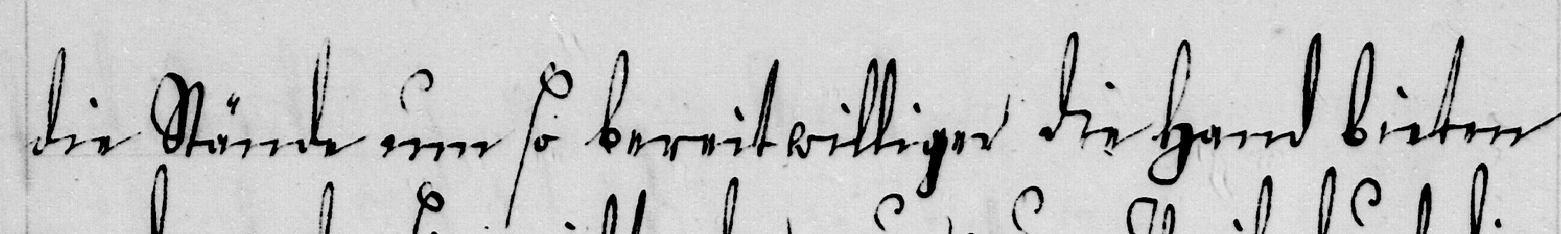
die Stände um so bereitwilliger die Hand bieten
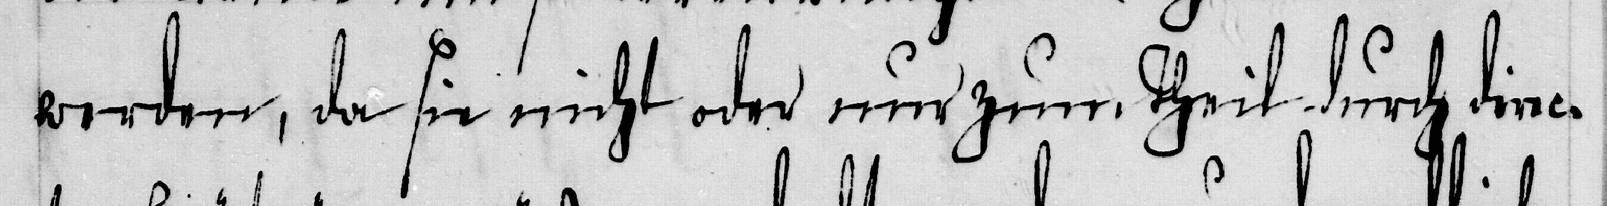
werden, da sie nicht oder nur zum Theil durch dire¬
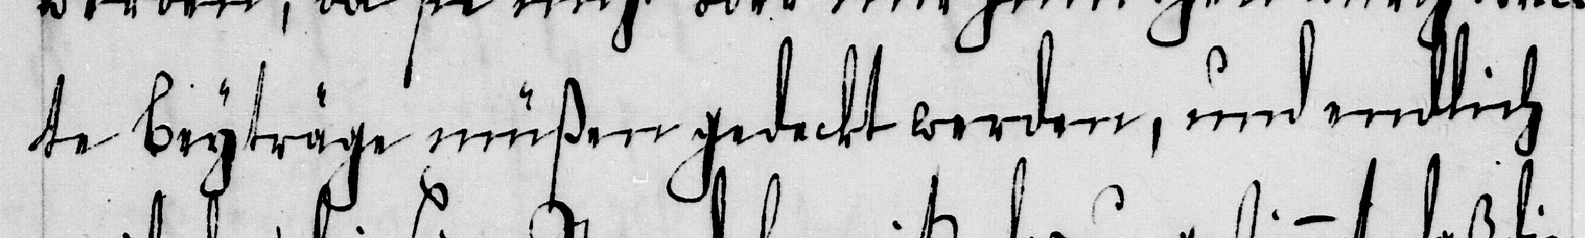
cte Beyträge müßen gedeckt werden, und endlich
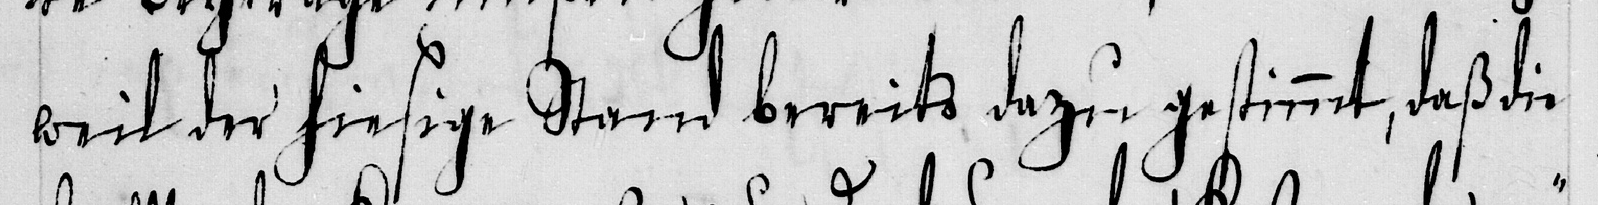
weil der hiesige Stand bereits dazu gestimmt, daß die
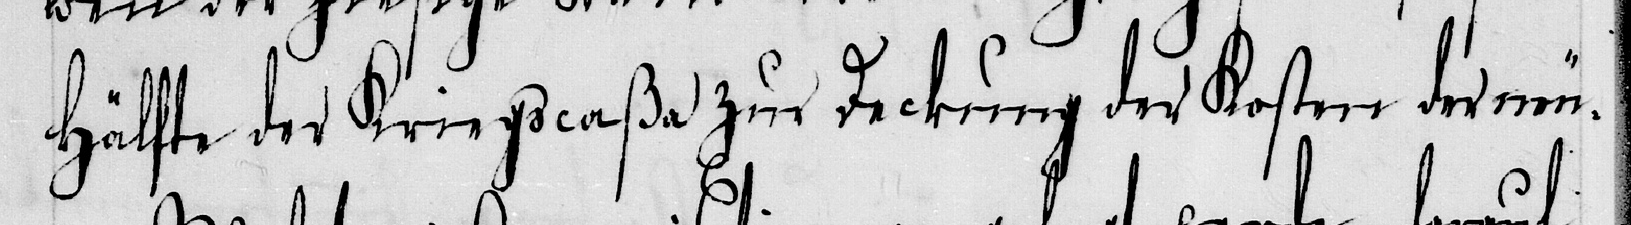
Hälfte der Kriegscaßa zur Deckung der Kosten der neu¬
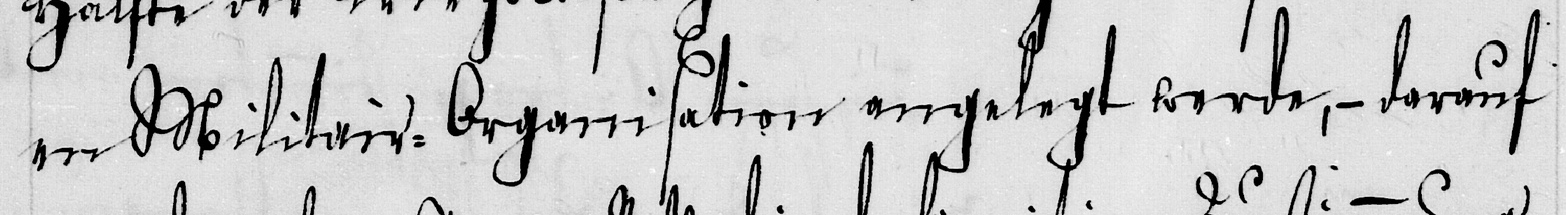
en Militair-Organisation angelegt werde, – darauf
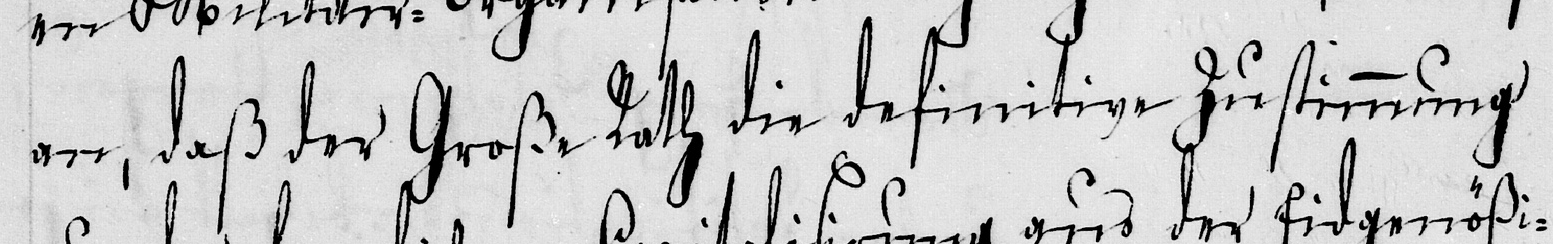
an, daß der Große Rathe die definitive Zustimmung
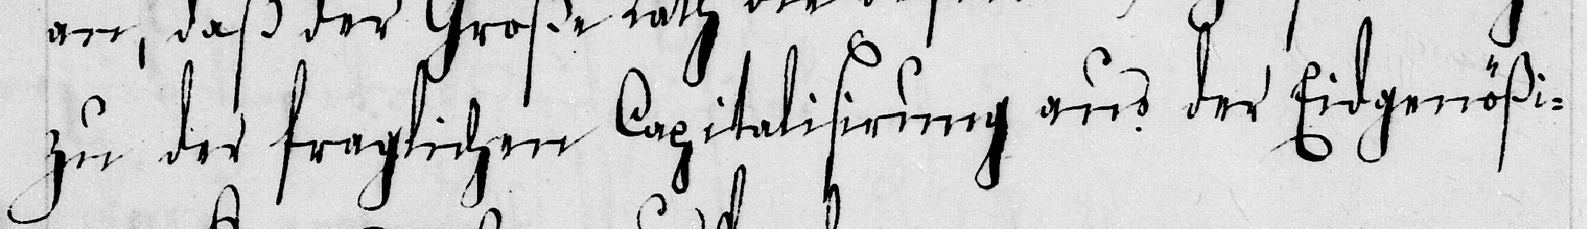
zu der fraglichen Capitalisirung aus der Eidgenößi¬
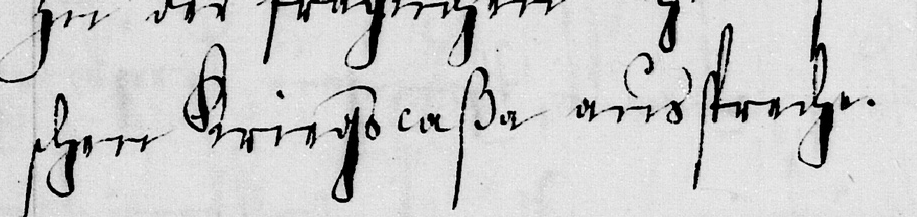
schen Kriegscaßa ausspreche.
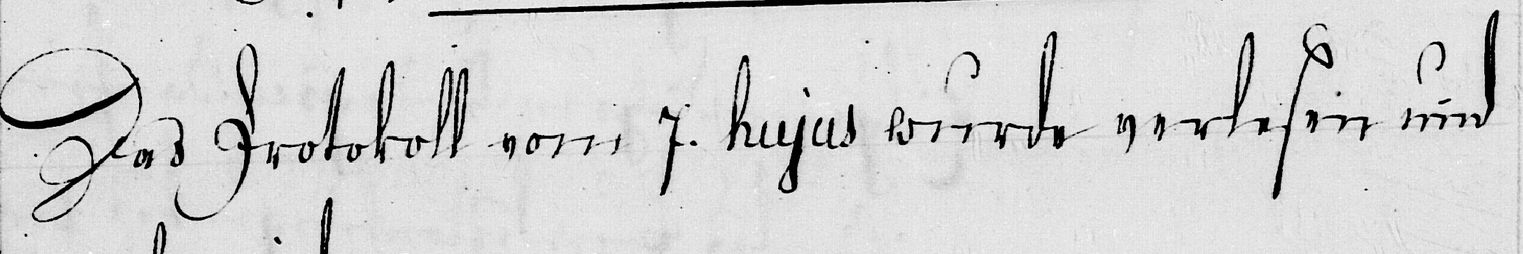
Das Protokoll vom 7. hujus wurde verlesen und
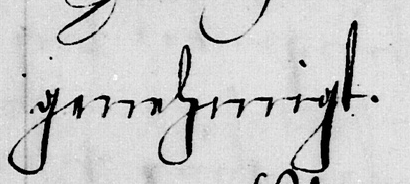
genehmigt.
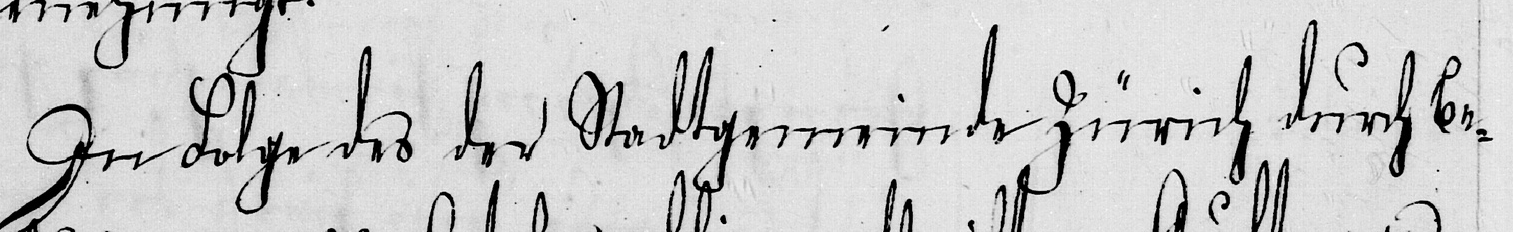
In Folge des der Stadtgemeinde Zürich durch B¬
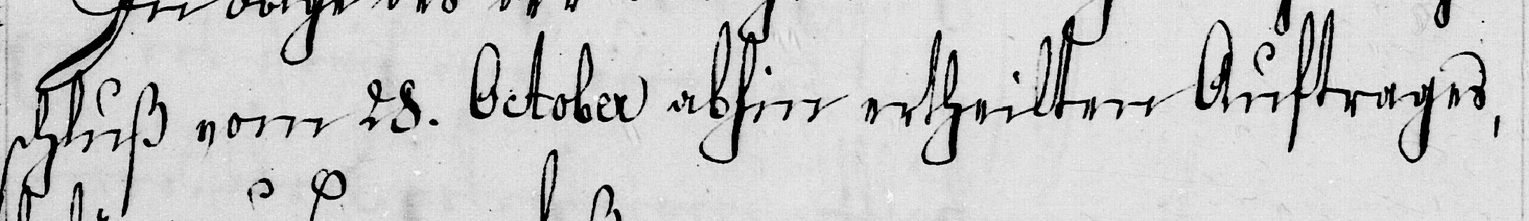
chluß vom 28. October abhin ertheilten Auftrages,
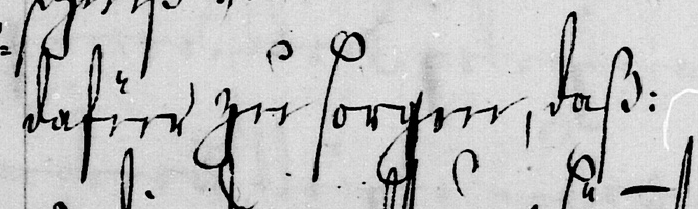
dafür zu sorgen, daß:
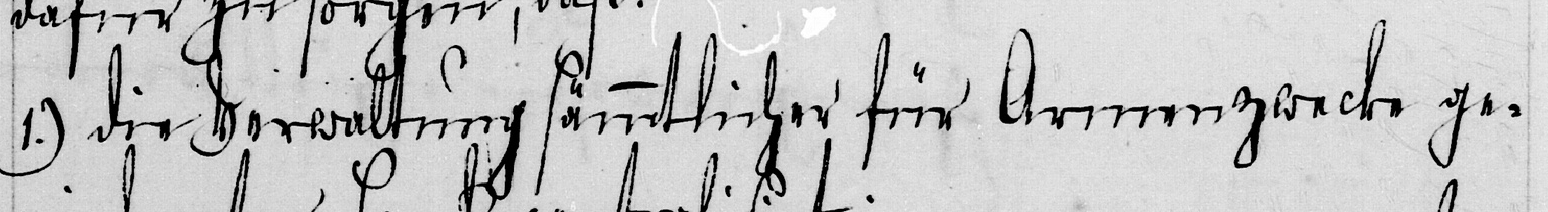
1.) die Verwaltung sämmtlicher für Armenzwecke ge¬
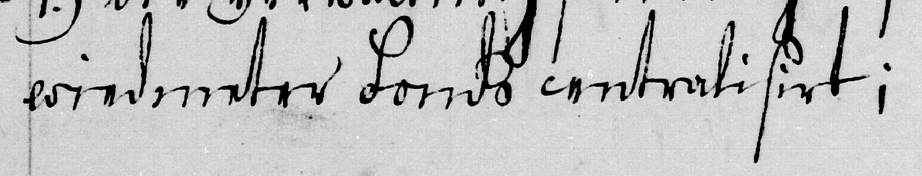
wiedmeter Fonds centralisirt;
